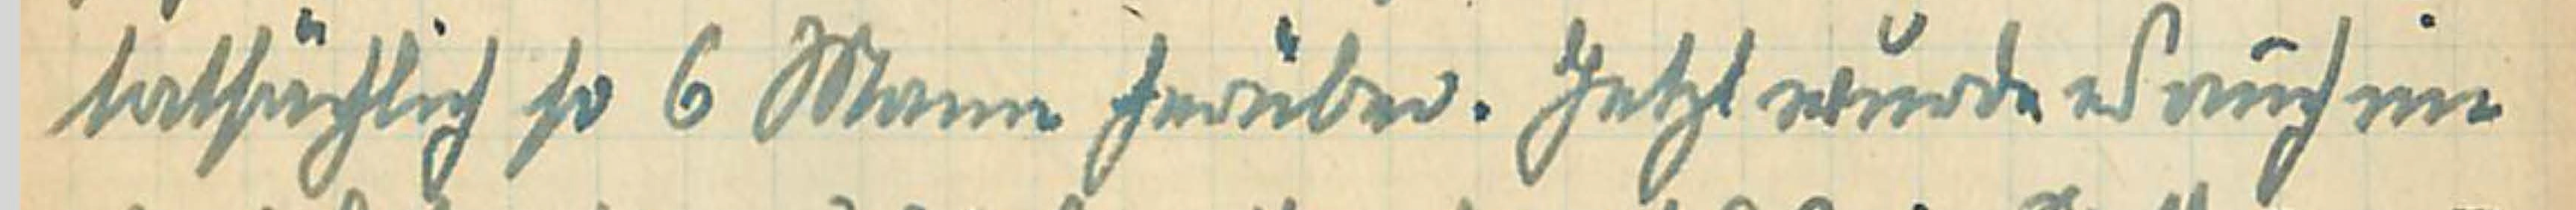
tatsächlich so 6 Mann herüber. Jetzt wurde es auch im
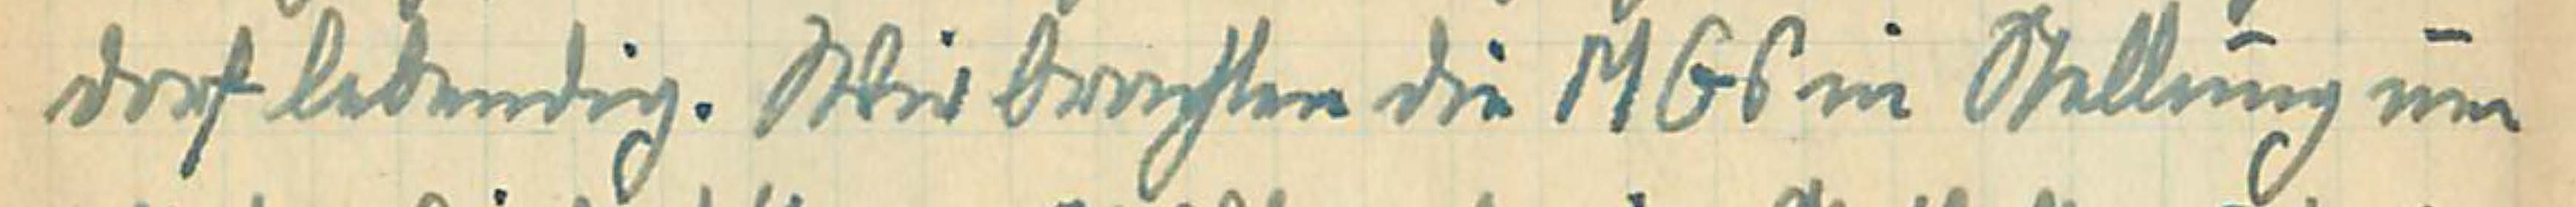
Dorf lebendig. Wir brachten die MGs in Stellung um
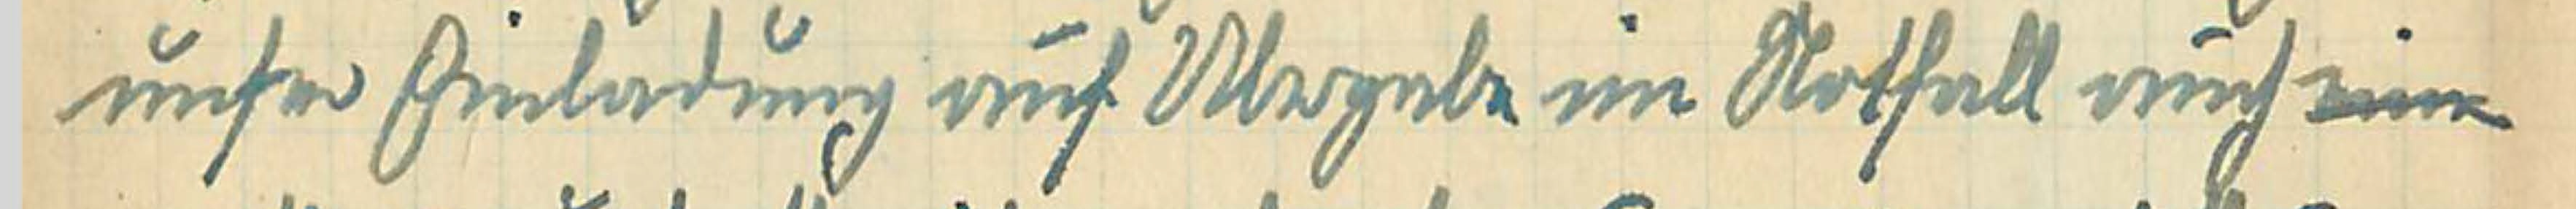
unser Einladung auf Ubergabe im Notfall auch eine
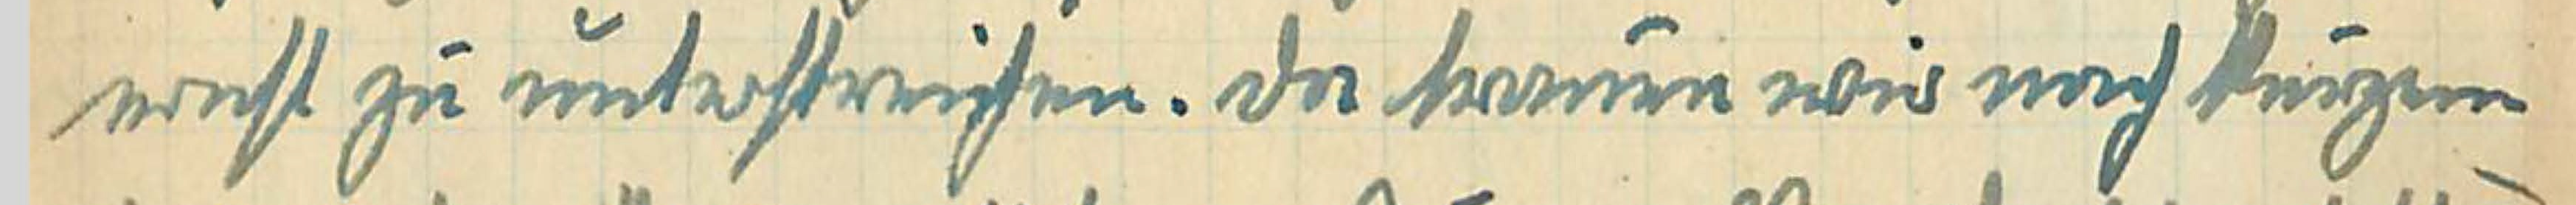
ernst zu unterstreichen. Da trauen wir nach kurzem
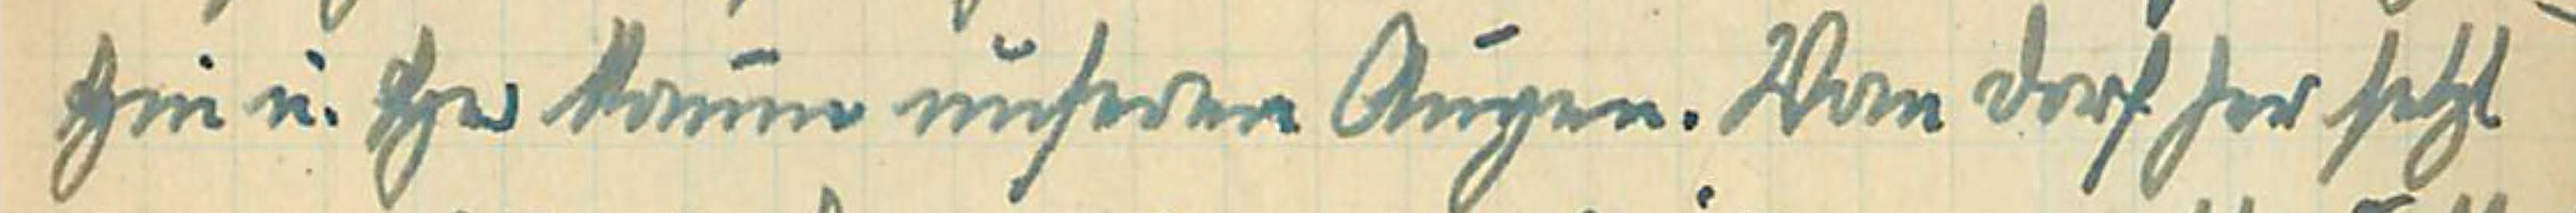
Hin u. Her kaum unseren Augen. Vom Dorf her setzt
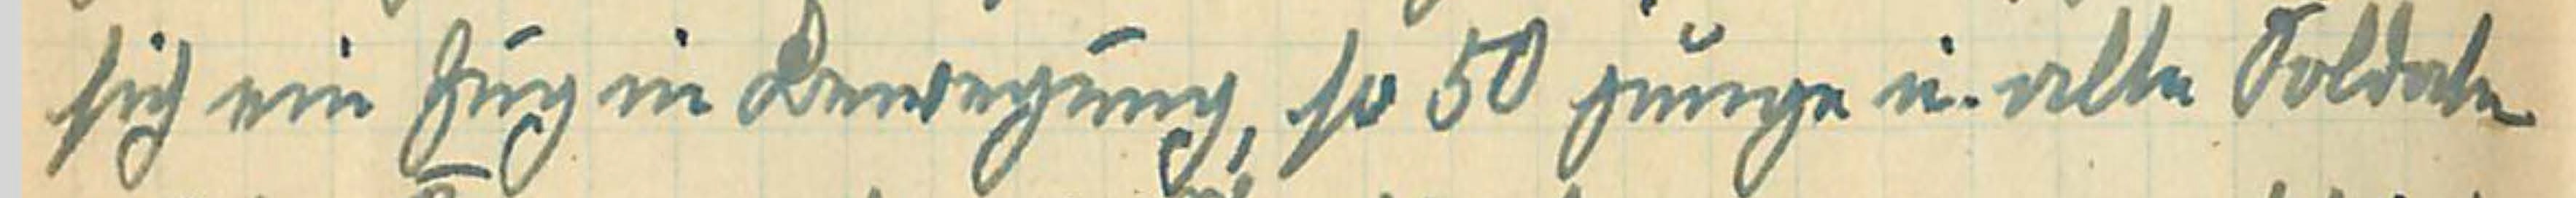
sich ein Zug in Bewegung, so 50 junge u. alte Soldaten
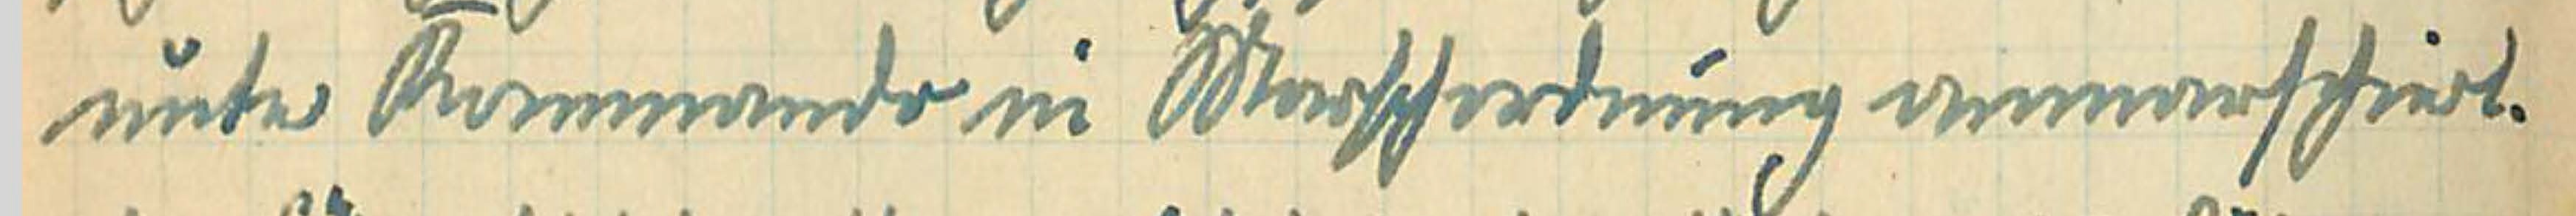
unter Kommando in Marschordnung anmarschiert.
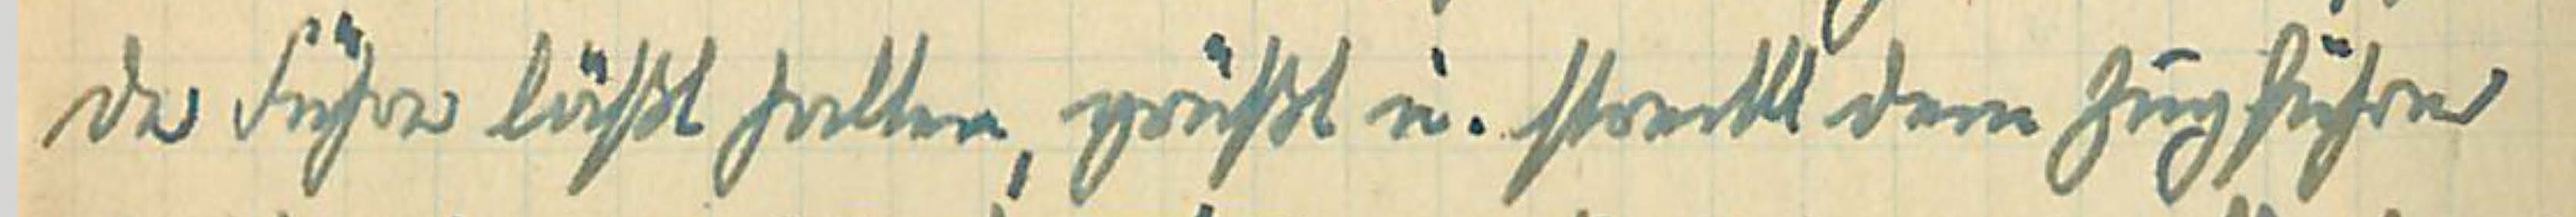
Der Führer läßt halten, grüßt u. streckt dem Zugführer
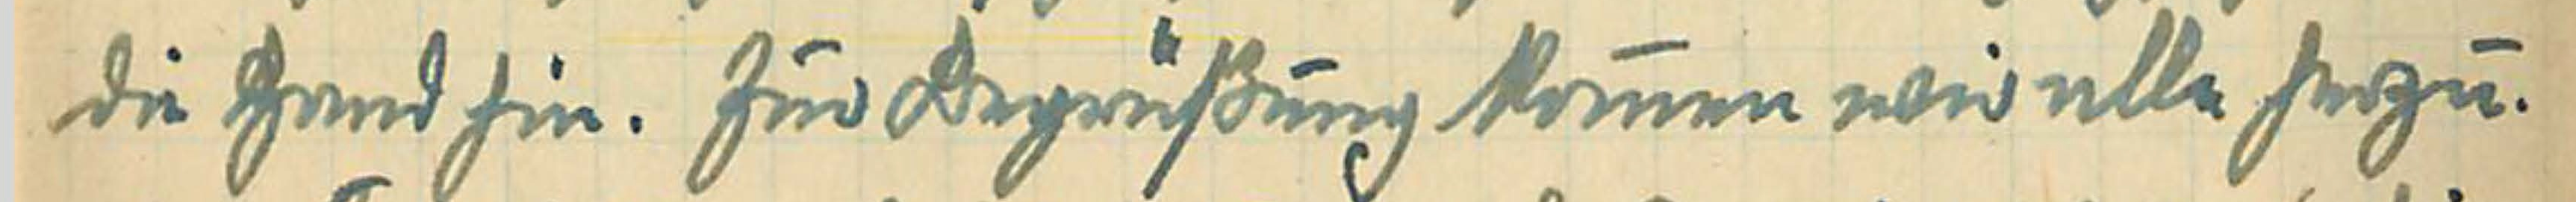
die Hand hin. Zur Begrüßung kommen wir alle herzu.
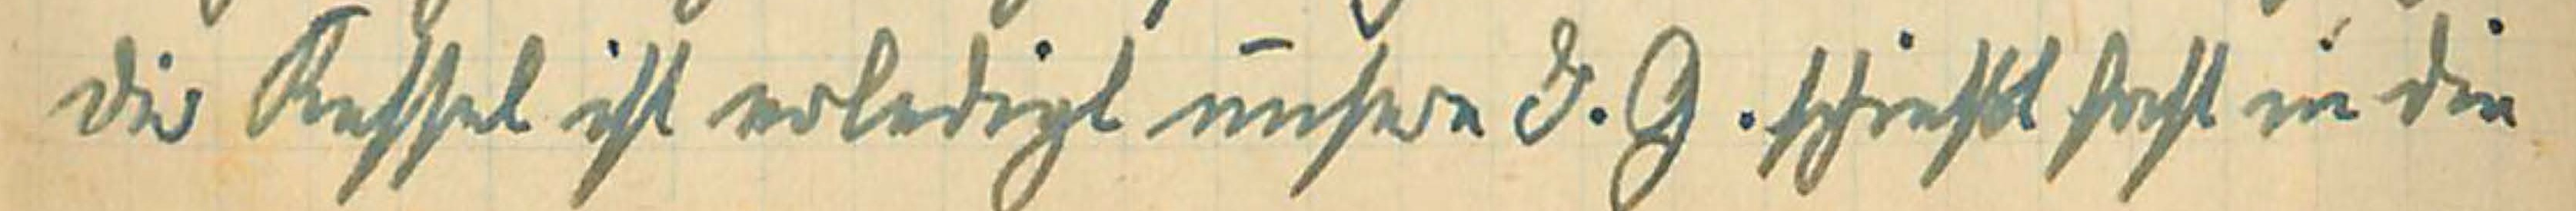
Der Kessel ist erledigt unsere I.G. schießt fast in die
